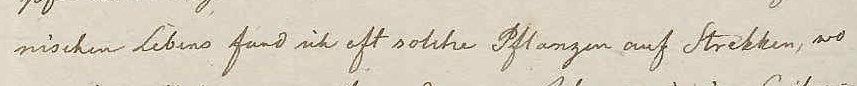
nischen Lebens fand ich oft solche Pflanzen auf Strekken, wo
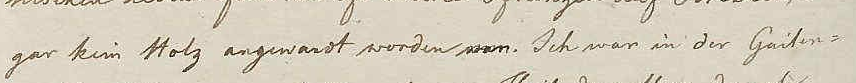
gar kein Holz angewandt worden war. Ich war in der Gailen-
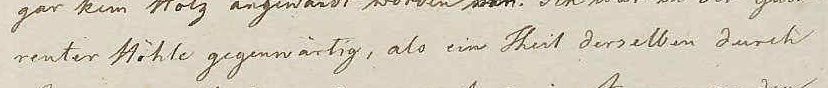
reuter Höhle gegenwärtig, als ein Theil derselben durch
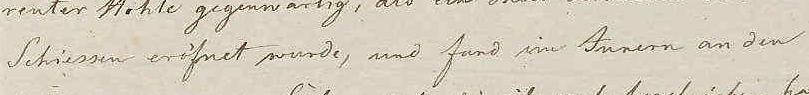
Schiessen eröfnet wurde, und fand im Innern an den
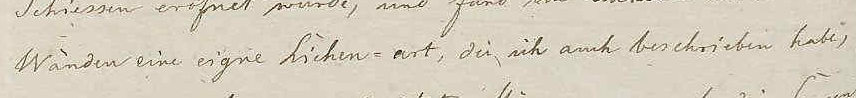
Wänden eine eigne Lichen-art, die ich auch beschrieben habe,
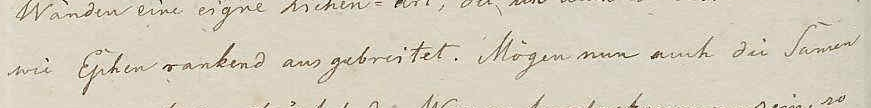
wie Epheu rankend ausgebreitet. Mögen nun auch die Samen
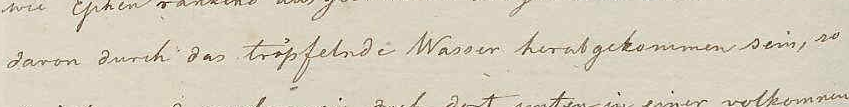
davon durch das tröpfelnde Wasser herabgekommen sein, so
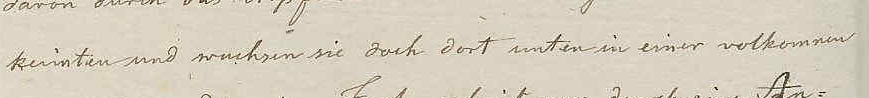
keimten und wuchsen sie doch dort unten in einer volkomnen
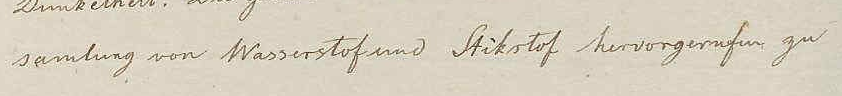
samlung von Wasserstof und Stikstof hervorgerufen zu
